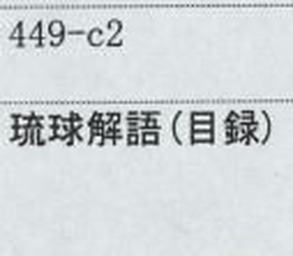琉球解語全
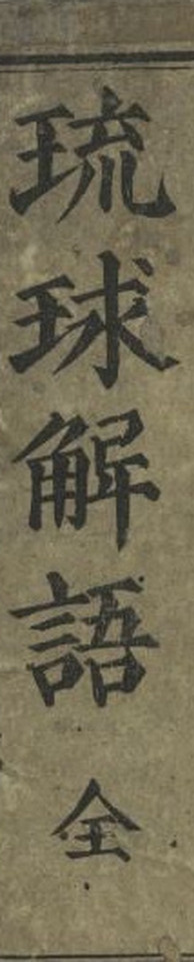琉球解語全

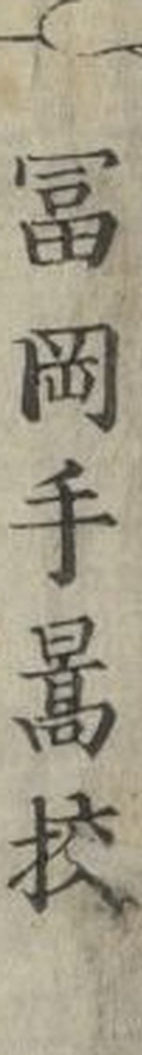冨岡手暠校
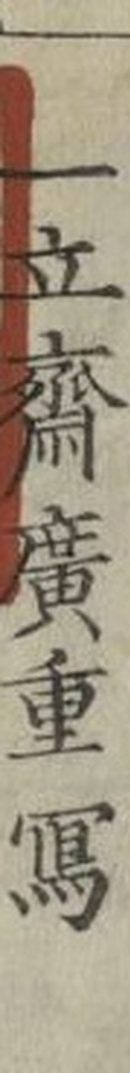一立齋廣重冩
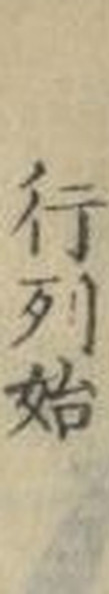行列始
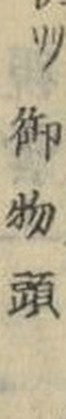御物頭
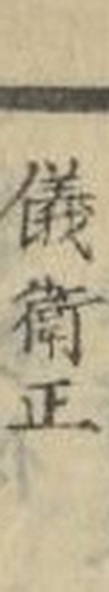儀衛正
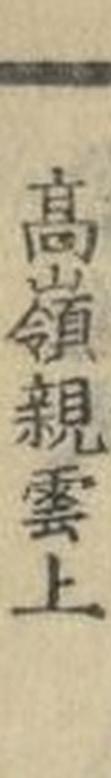高嶺親雲上

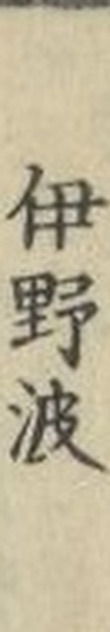伊野波
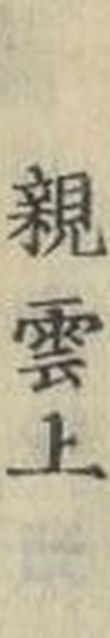親雲上
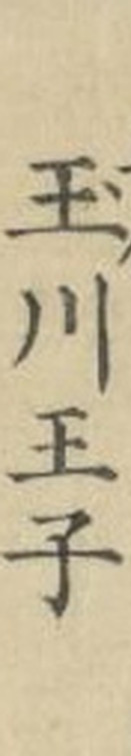玉川王子

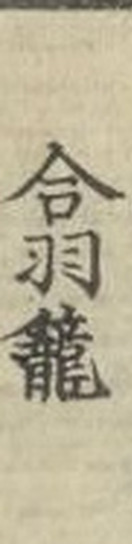合羽籠
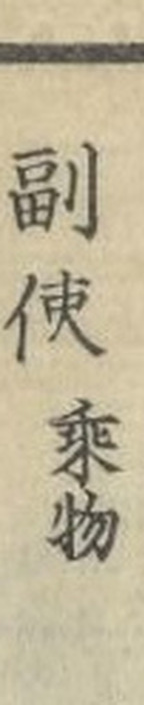副使乗物
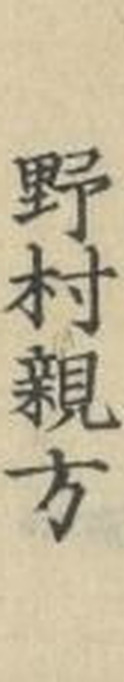野村親方
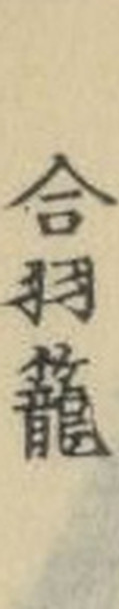合羽籠
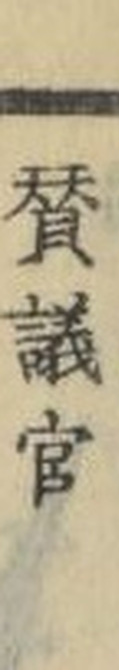賛議官
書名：琉球解語
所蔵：University of the Ryukyus Library
